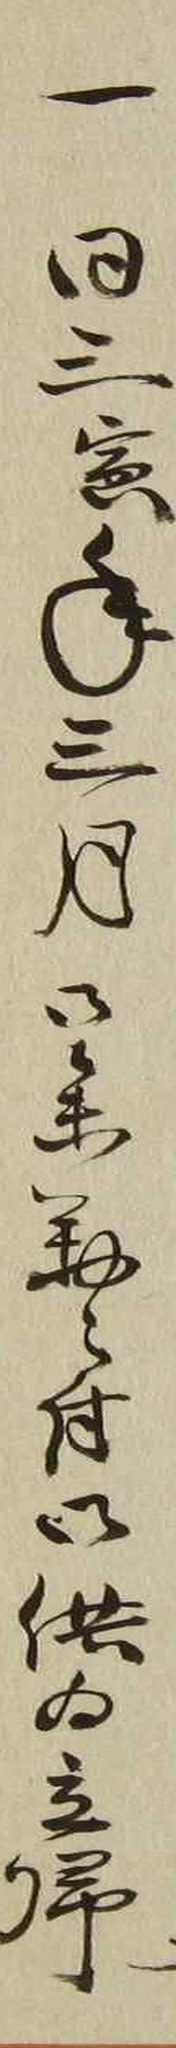一同三寅年三月御参勤ニ付御供為立帰
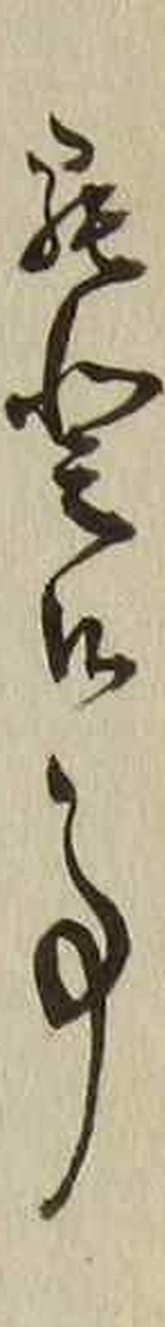罷登候事
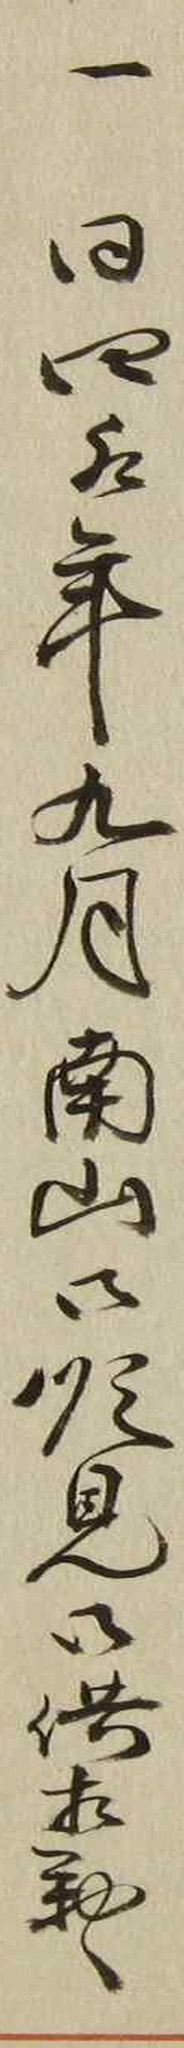一同四卯年九月南山御順見御供相勤候
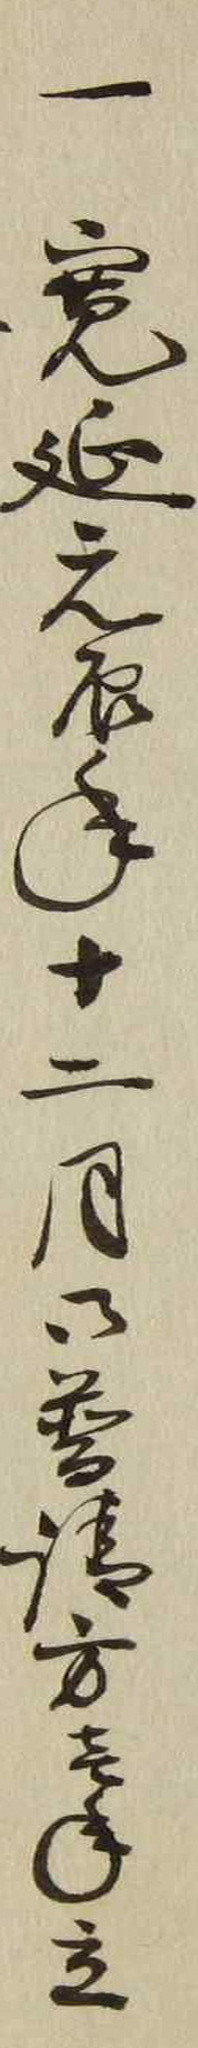一寛延元辰年十二月御普請方壱年立
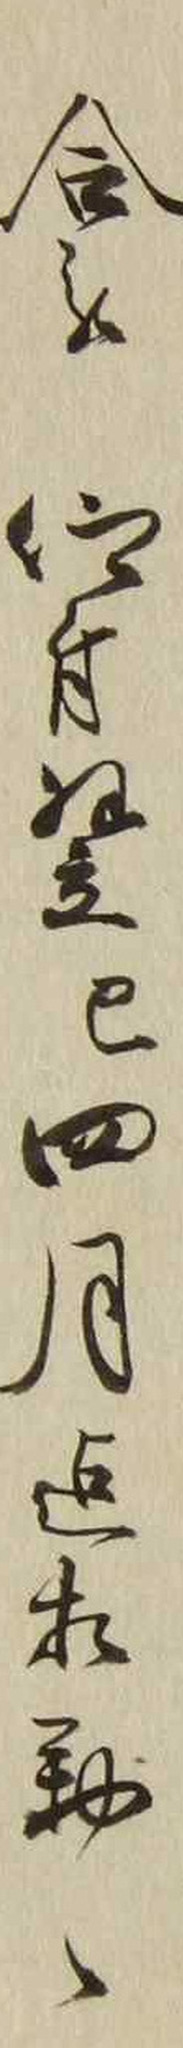合被仰付翌実巳四月迄相勤候
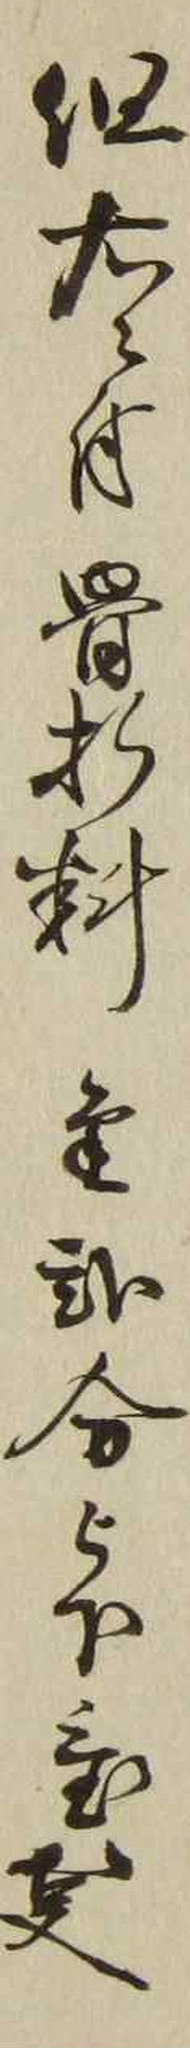但右ニ付骨折料金弐分被下置候事
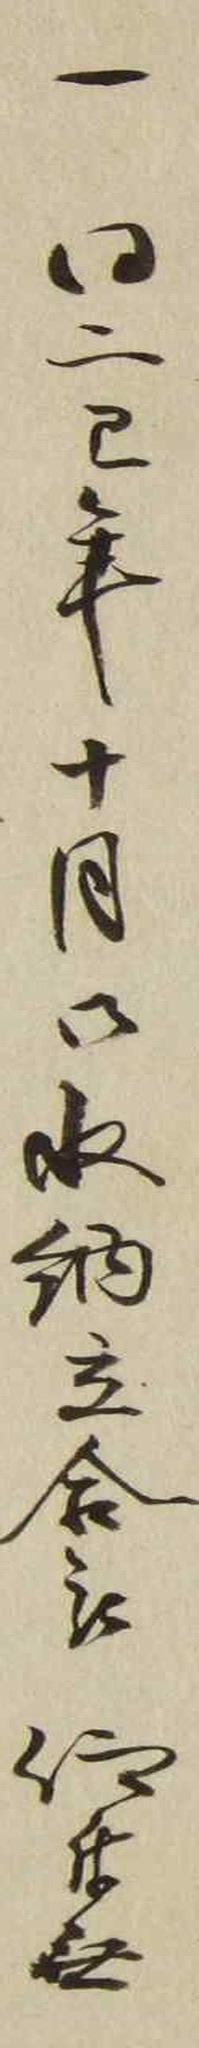一同二巳年十月御収納立会被仰付無

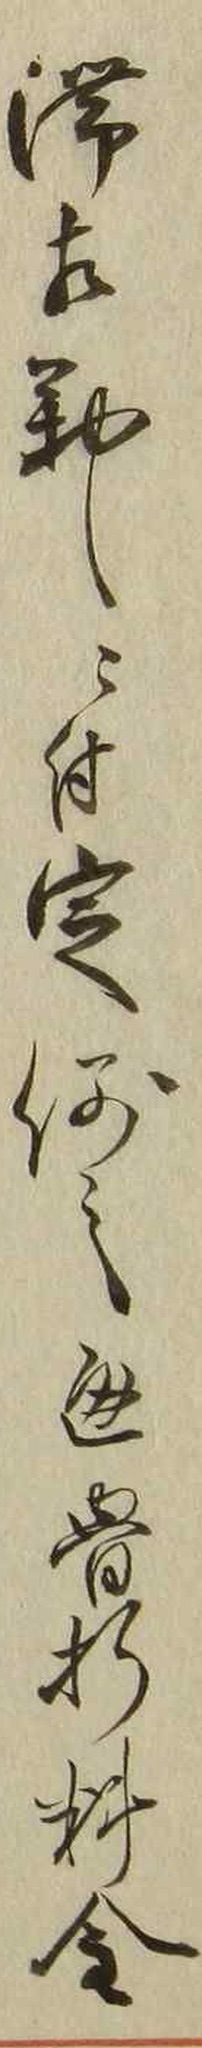滞相勤候ニ付定例之通骨折料金
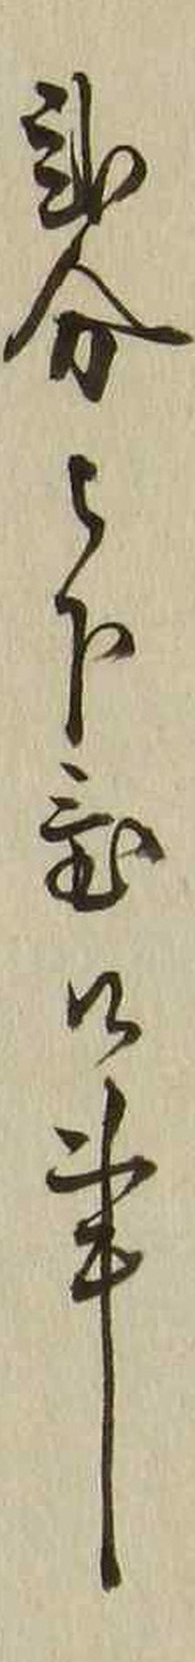弐分被下置候事
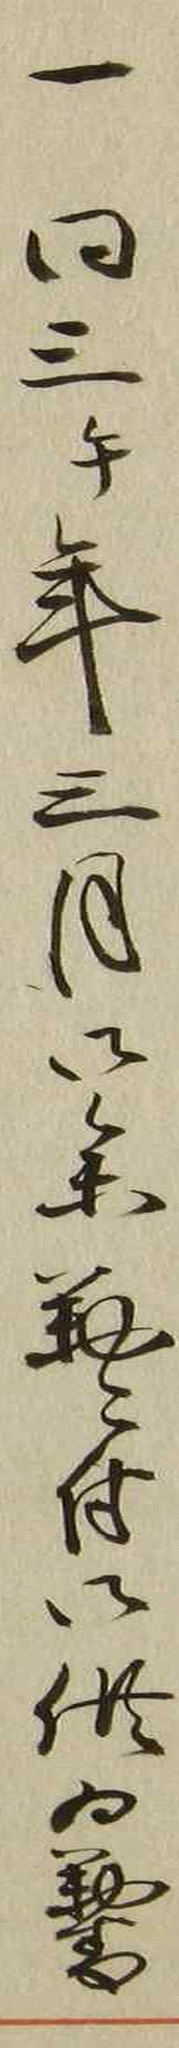一同三午年三月御参勤ニ付御供為勤番
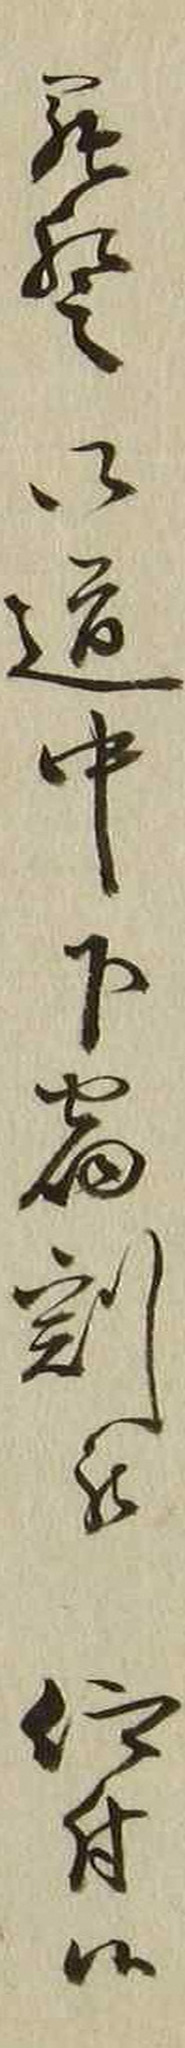罷登御道中下宿割被仰付候
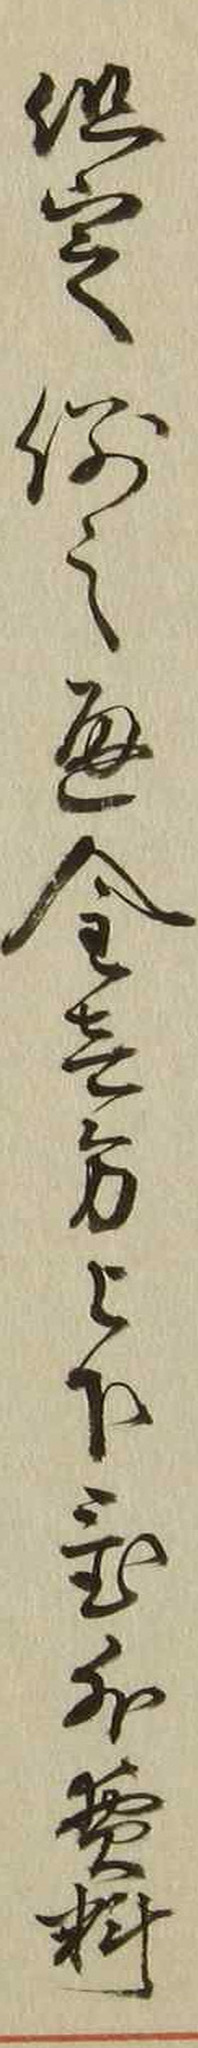但定例之通金一分被下置外務料
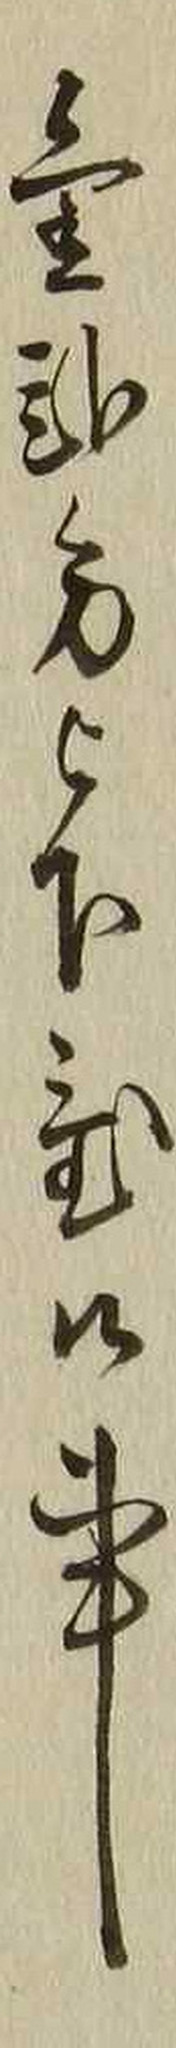金弐分被下置候事
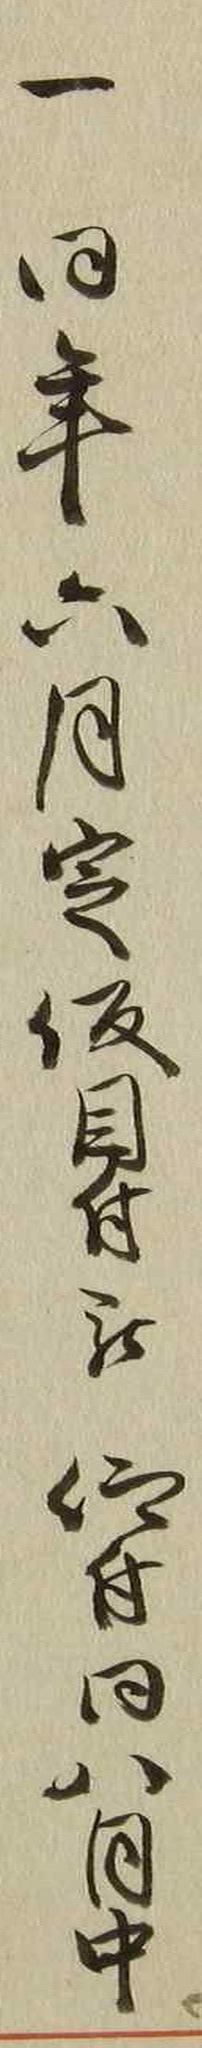一同年六月定仮目付被仰付同八月中
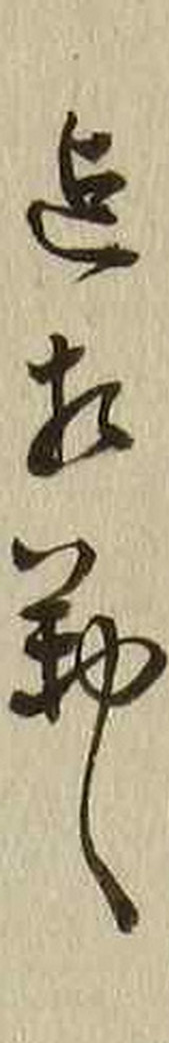迄相勤候
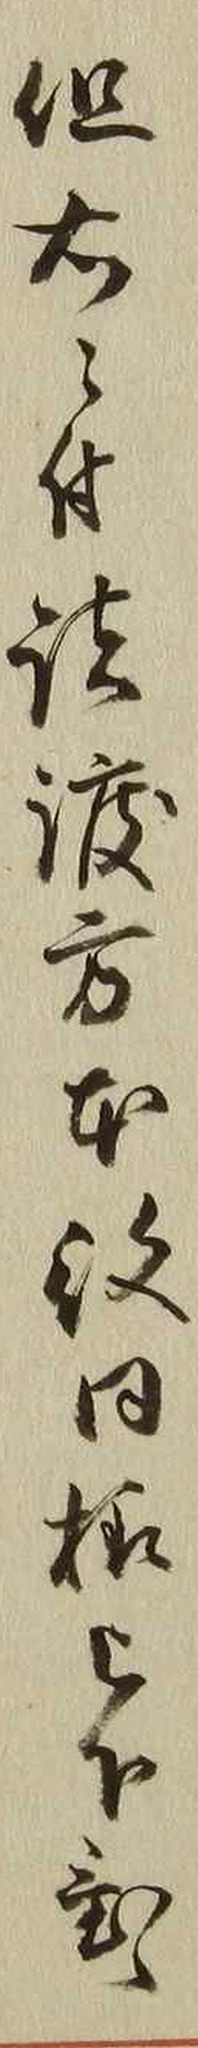但右ニ付諸渡方本役同様被下置候
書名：諸士系譜　巻之65　ち之部1
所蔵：会津若松市立会津図書館
